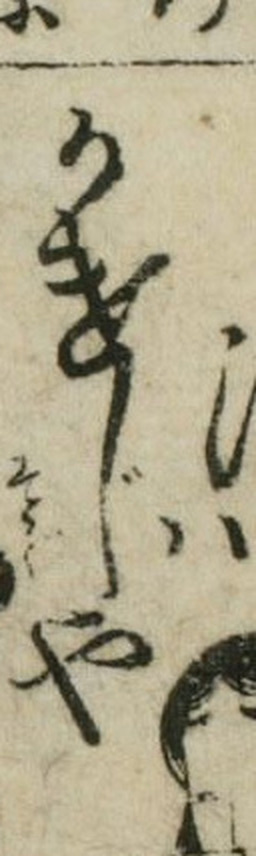かけじや
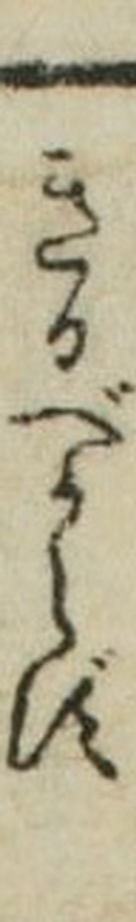きるべからず
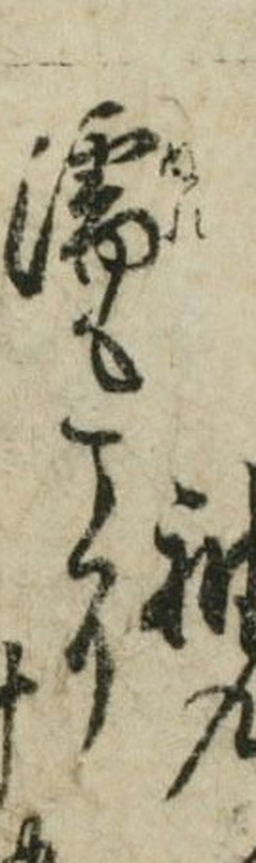濡もこそ
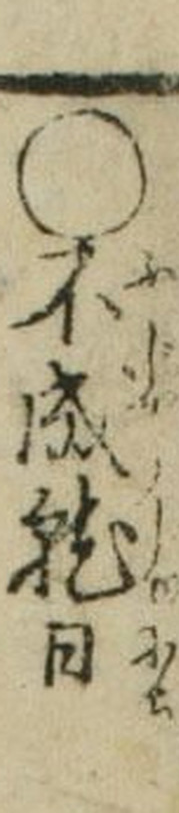○不成就日
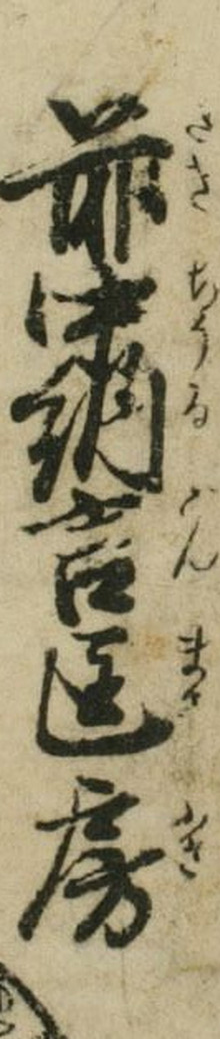前中納言匡房
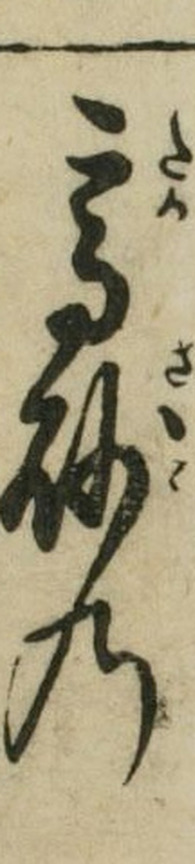高砂の
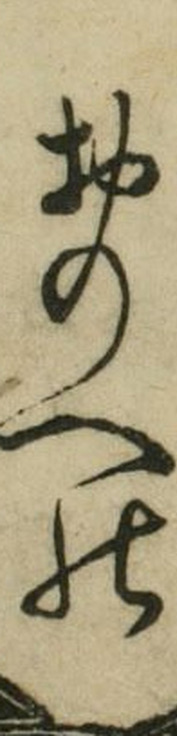おのへの
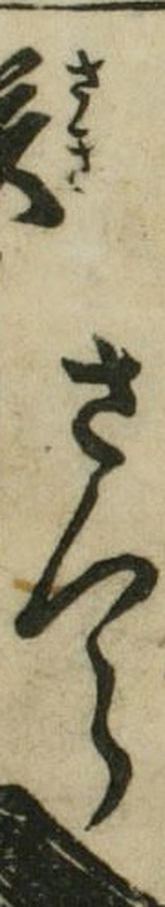さくら
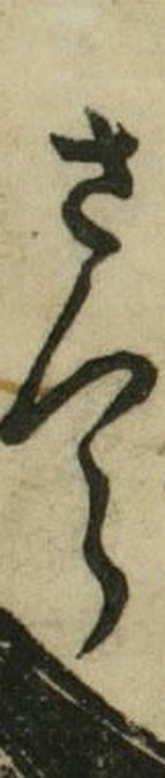さくら
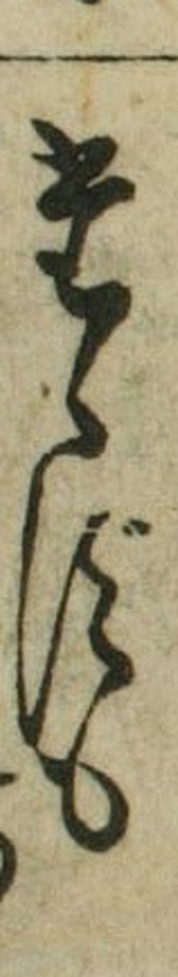たゝずも
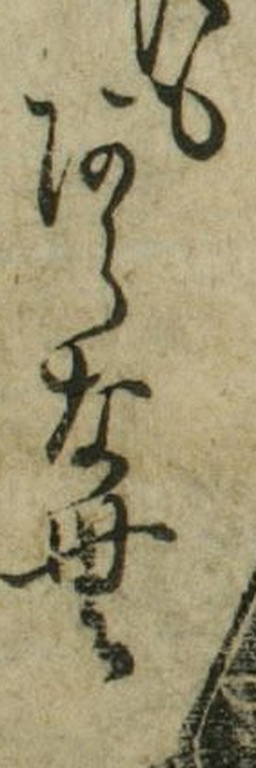あらなむ

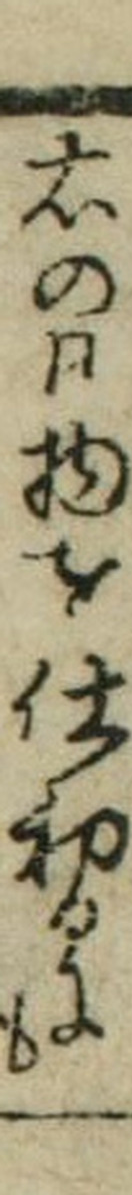右の日物を仕初るにも
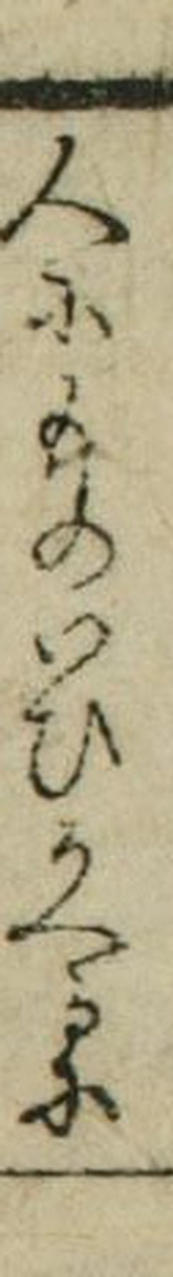人にものいひかへるに
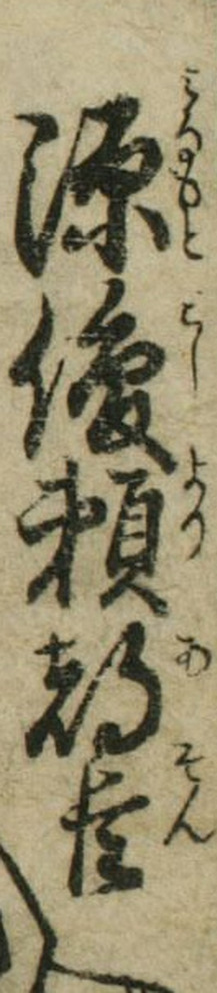源俊頼朝臣
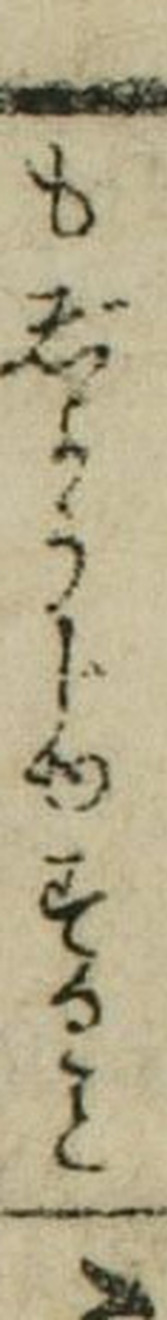もじようじゆすること
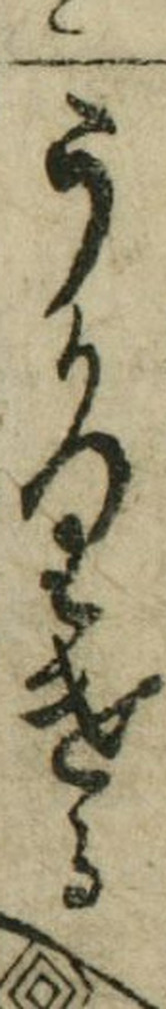うかりける
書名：百人一首
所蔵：東京学芸大学教育コンテンツアーカイブ
